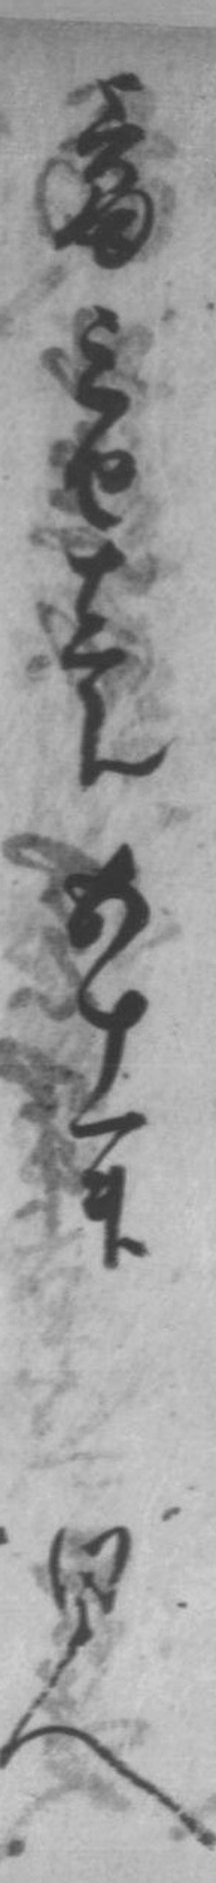荒畠三せ十二分五斗一升同人
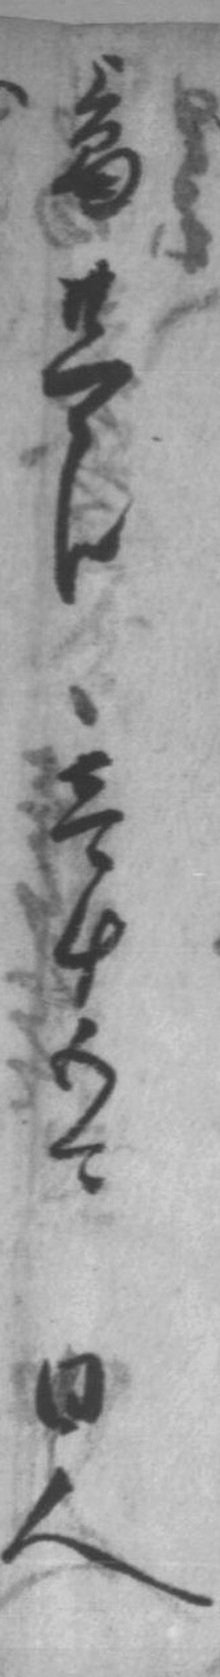上畠廿一分壱斗五合同人
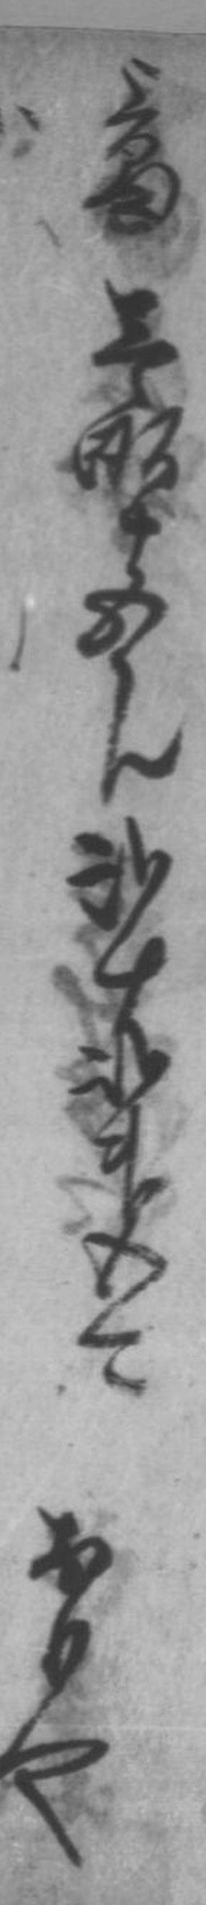上畠壱畝十五分弐斗弐升五合おりや
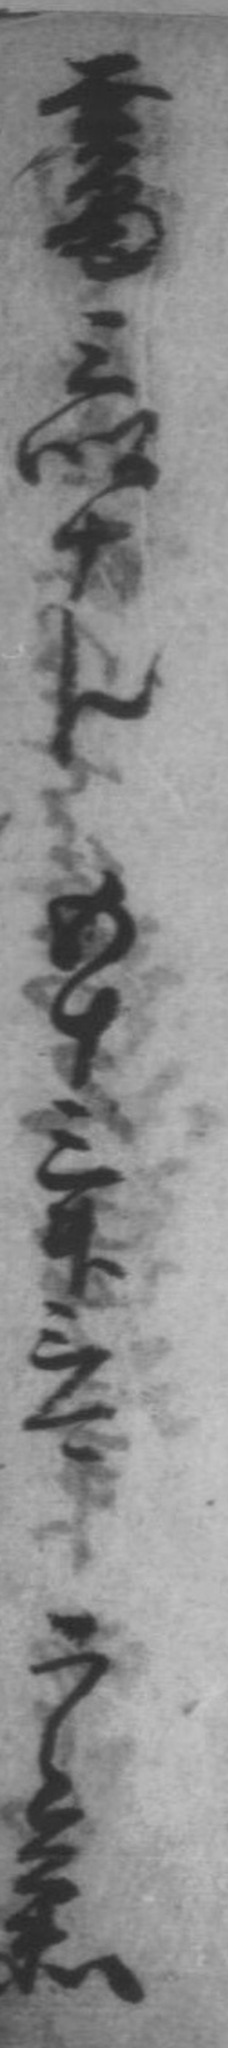荒畠三畝十分五斗三升三合二郎兵衛

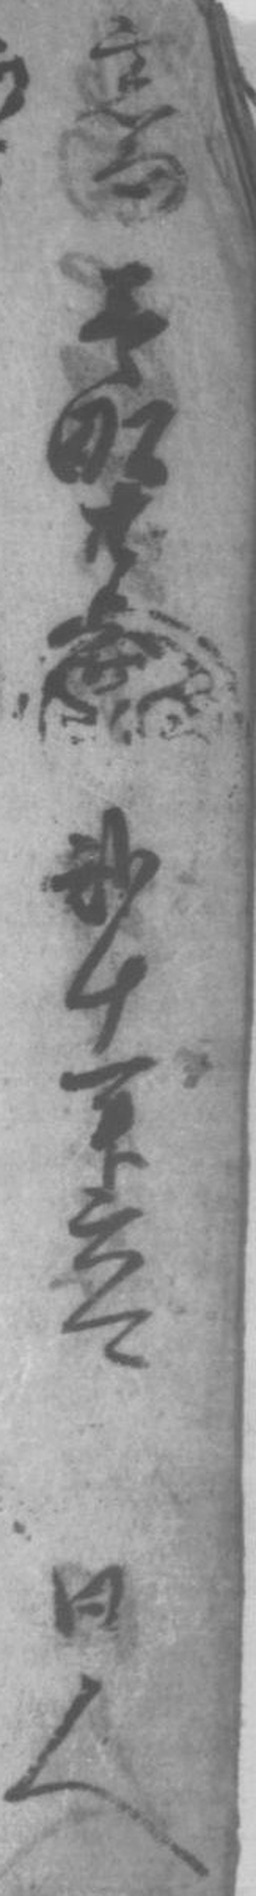荒畠壱畝弐拾歩㊞弐斗一升六合同人
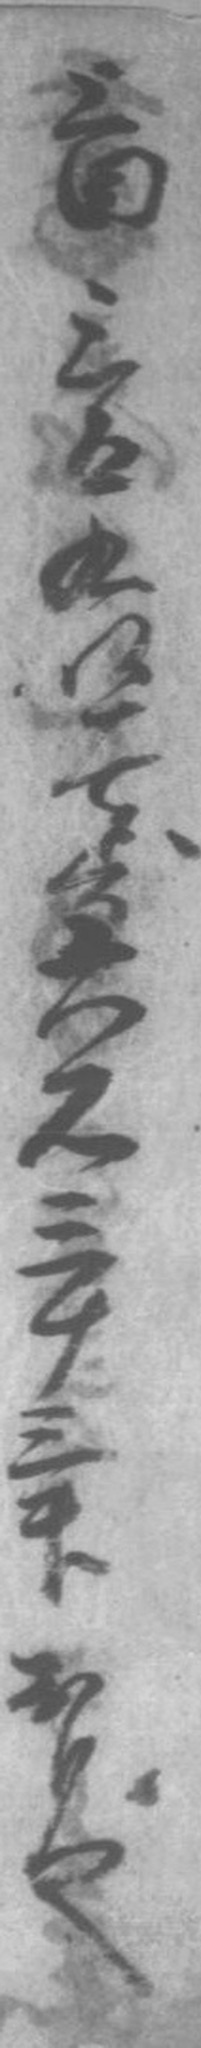上田三反九畝十七歩六石三斗三升おりや
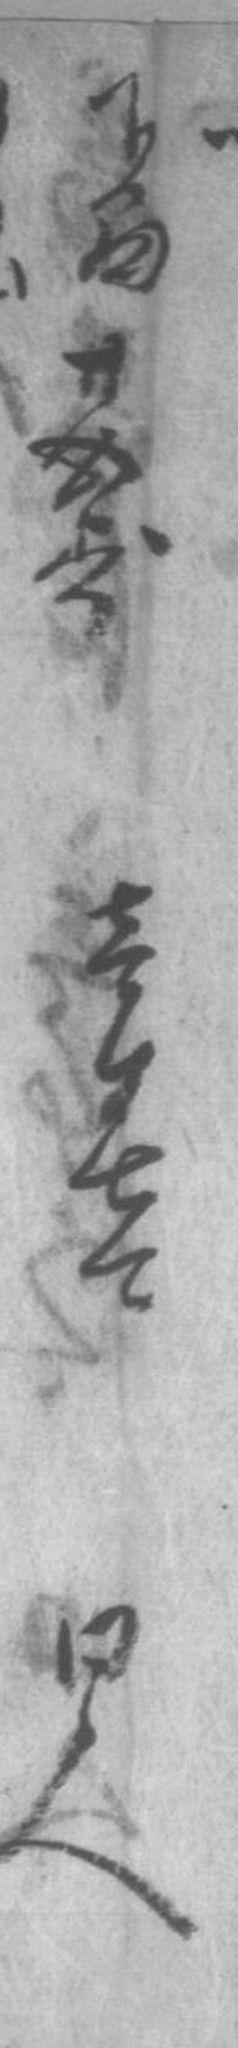下畠廿五歩壱斗七合同人
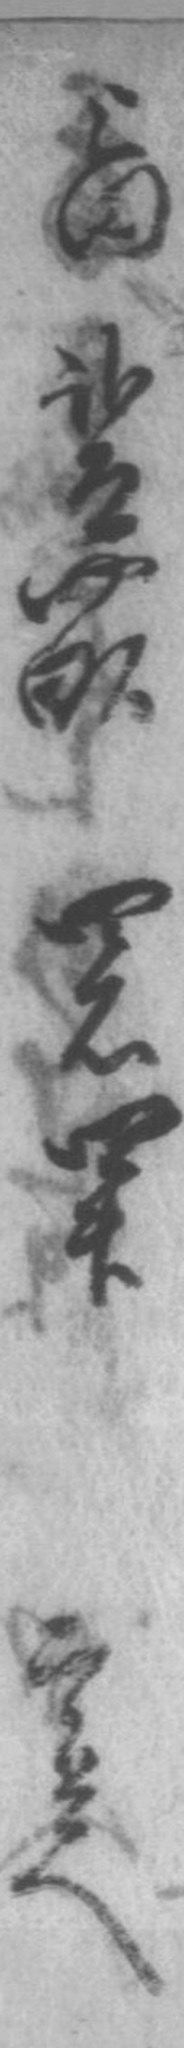上田弐反四畝四石四升二郎左衛門
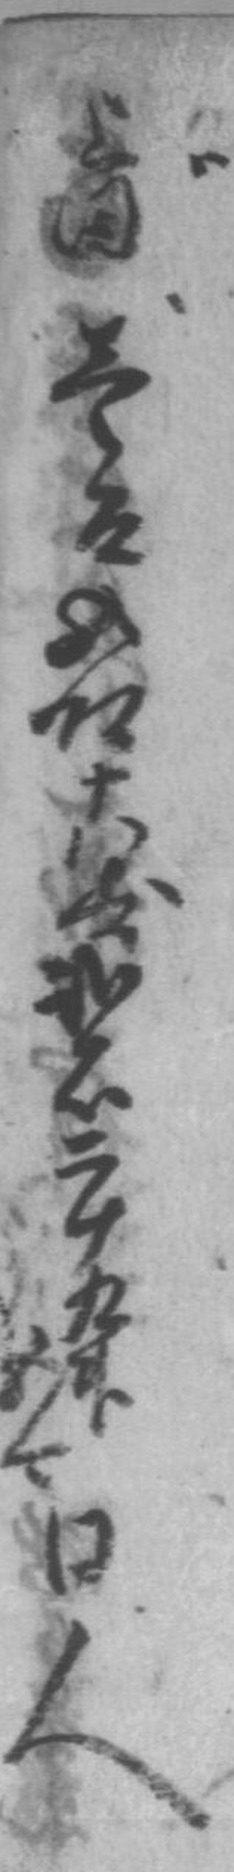上田壱反五畝十八歩弐石二斗九升五合同人
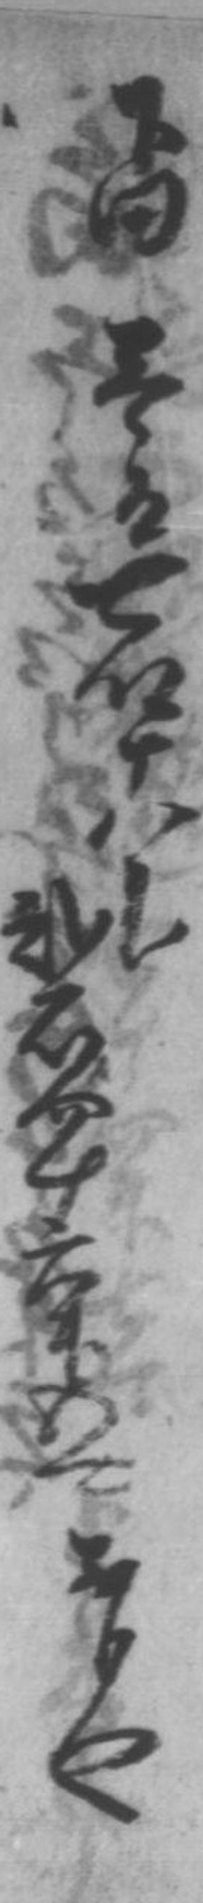下田壱反七畝十八歩弐石四斗六升五合おりや
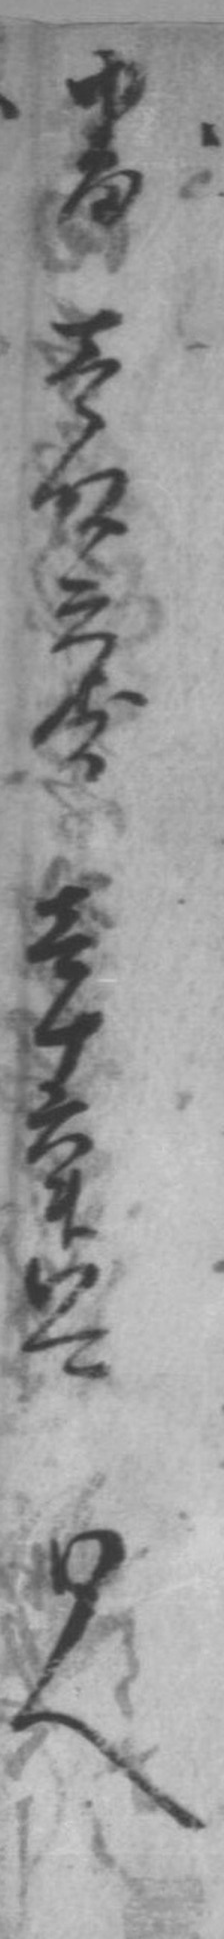中畠壱畝六歩壱斗六升八合同人

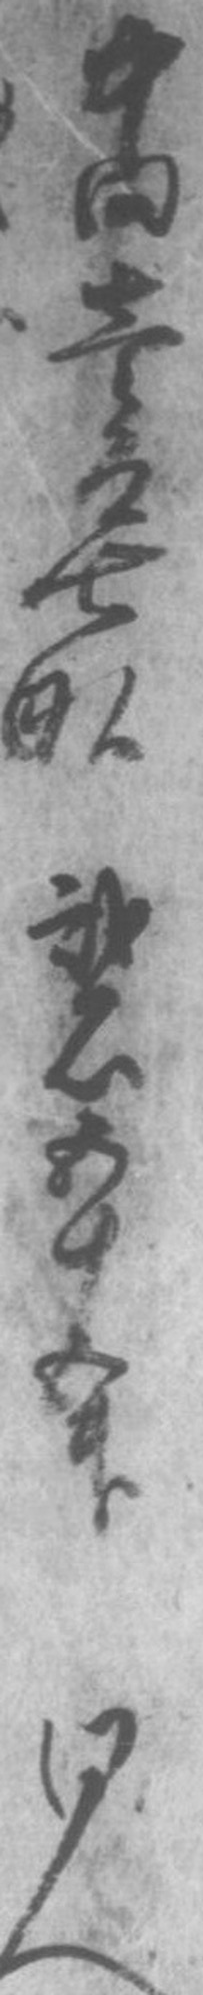中田壱反七畝弐石五斗五升同人
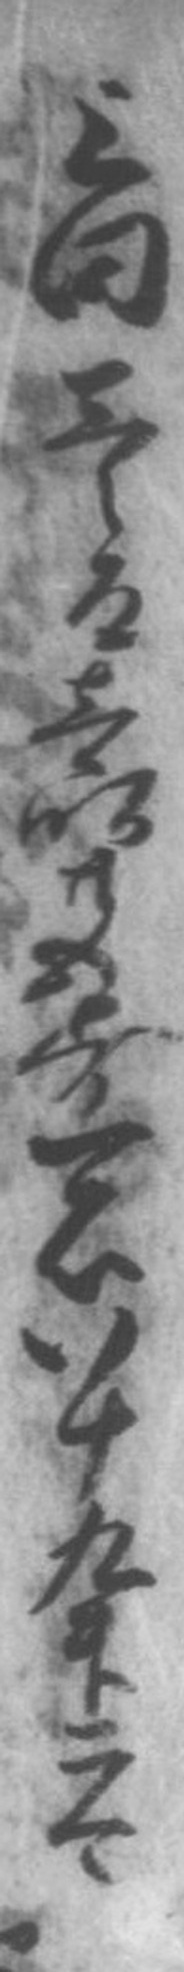上田壱反一畝廿五歩一石八斗九升二合与二郎
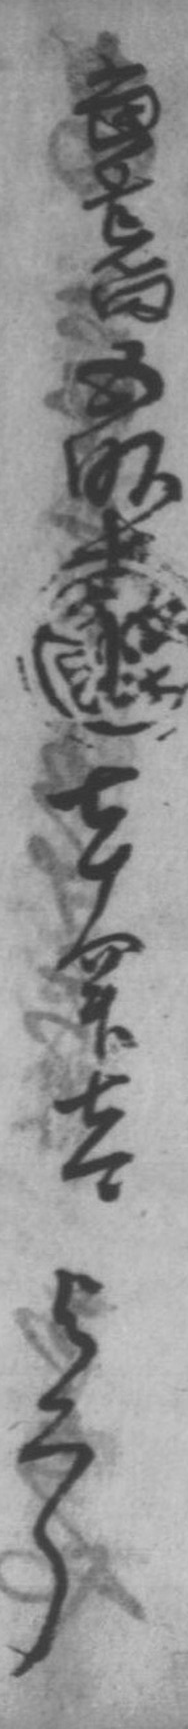荒田五畝十歩㊞七斗四升七合与二郎
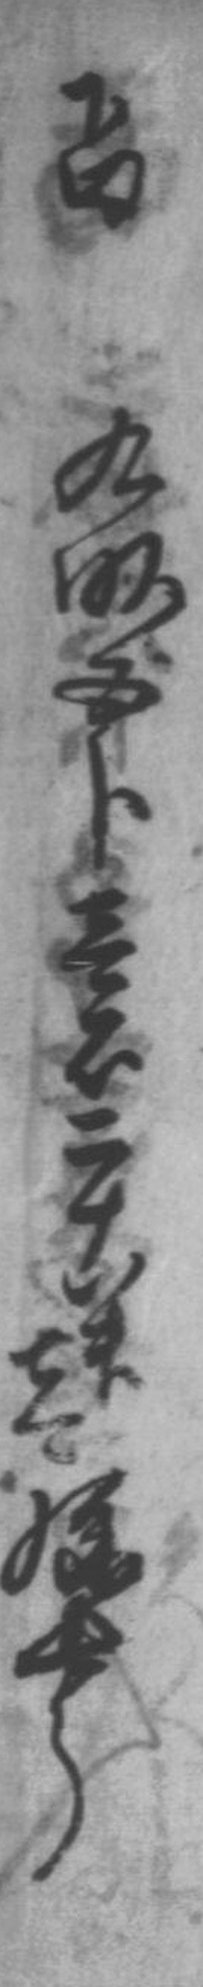下田九畝五分壱石二斗八升七合孫五郎
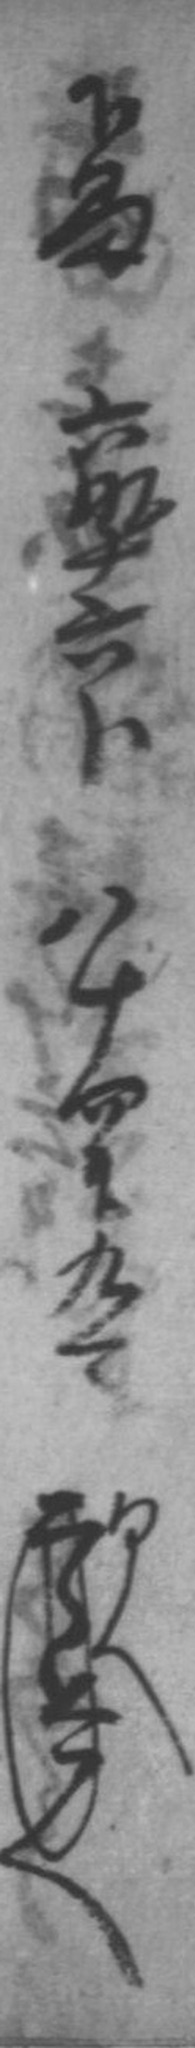下畠六畝十六分八斗四升九合同人
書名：越州大野郡ノ内不動堂村御検地帳
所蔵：福井県文書館 Fukui Prefectural Archives
